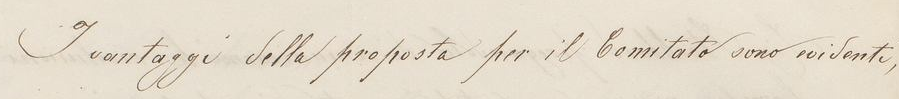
I vantaggi della proposta per il Comitato sono evidenti
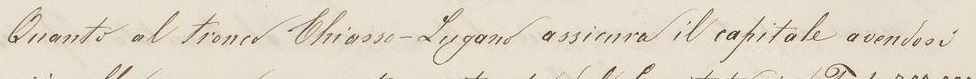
Quanto al tronco Chiasso–Lugano assicura il capitale avendosi
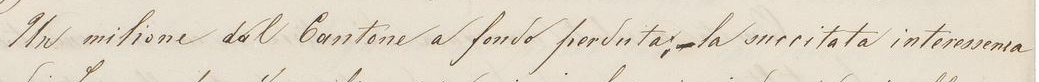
Un milione dal Cantone a fondo perduta; – la succitata interessenza
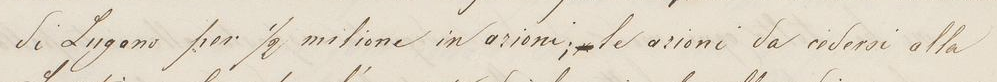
di Lugano per ½ milione in azioni; – le azioni da cedersi alla
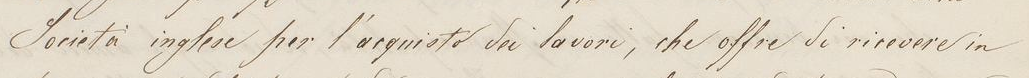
Società inglese per l'acquisto dei lavori, che offre di ricevere in
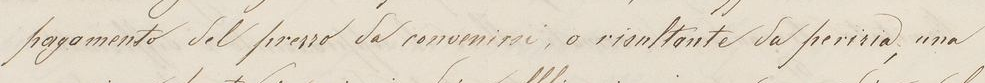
pagamento del prezzo da convenirsi, o risultante da perizia, una
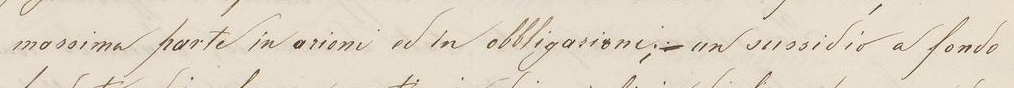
massima parte in azioni ed in obligazioni; – un sussidio a fondo
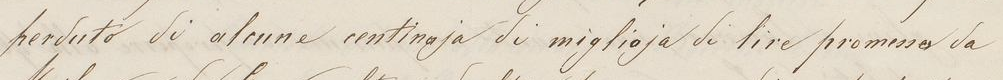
perduto di alcune centinaja di miglioja di lire promesse da
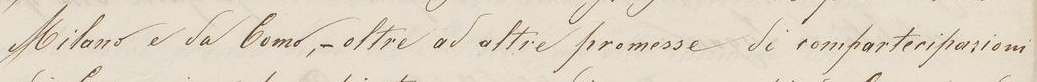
Milano e da Como, – oltre ad oltre promesse di compartecipazioni
